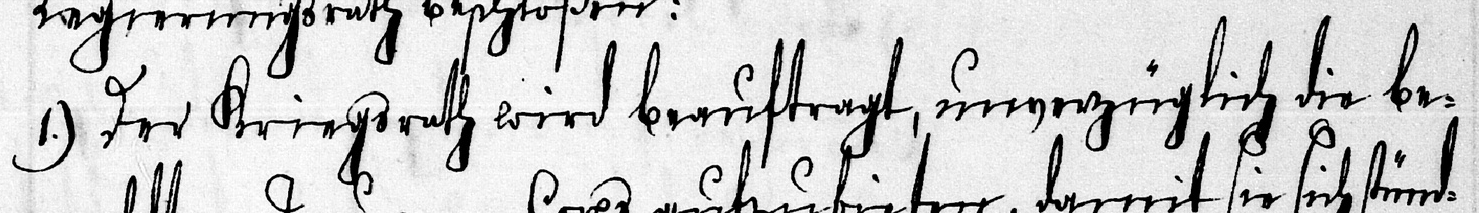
1.) Der Kriegsrath wird beauftragt, unverzüglich die be¬
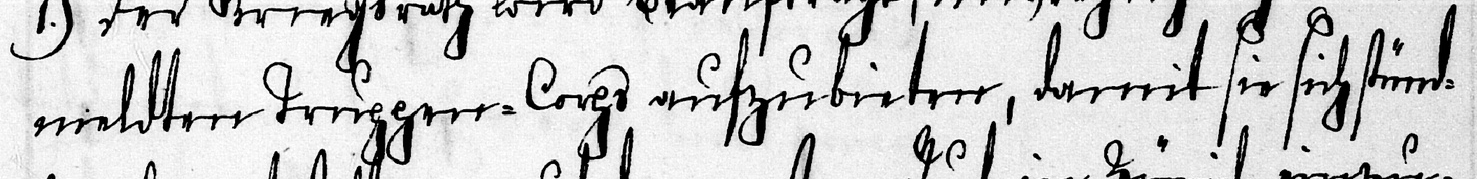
meldten Truppen-Corps aufzubieten, damit sie sich stün¬
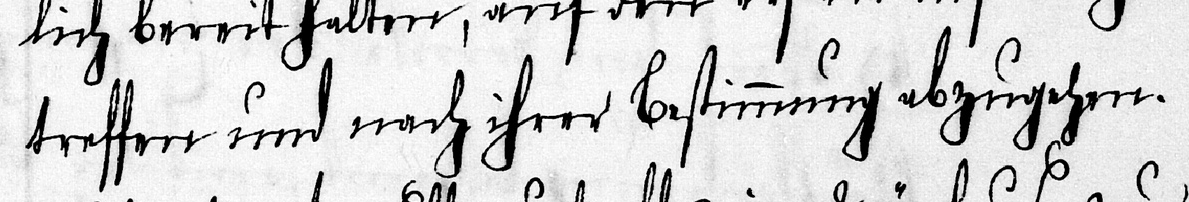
treffen und nach ihrer Bestimmung abzugehen.
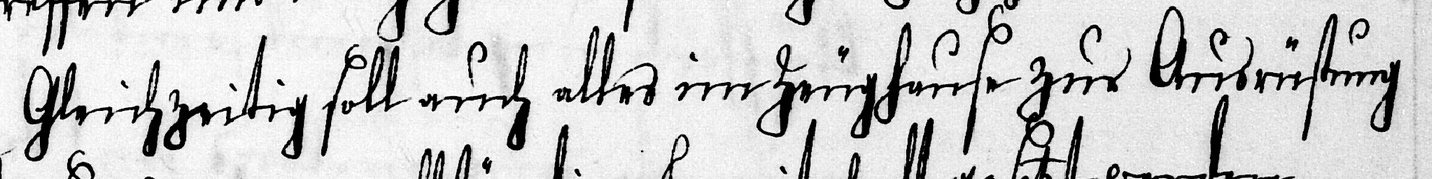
Gleichzeitig soll auch alles im Zeughause zur Ausrüstung
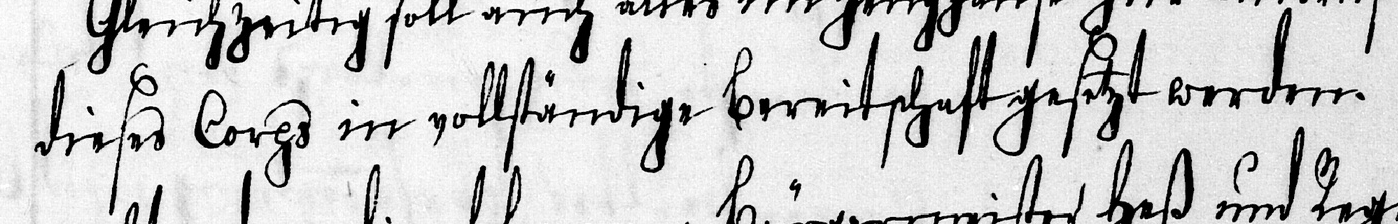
dieses Corps in vollständige Bereitschaft gesetzt werden.
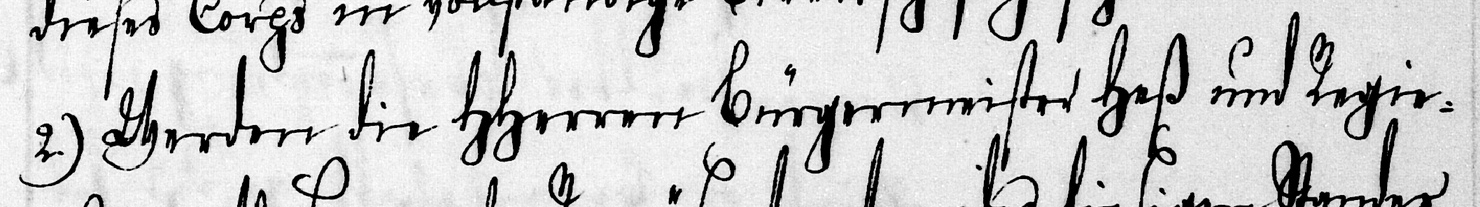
2.) Werden die HHerren Bürgermeister Heß und Regie¬
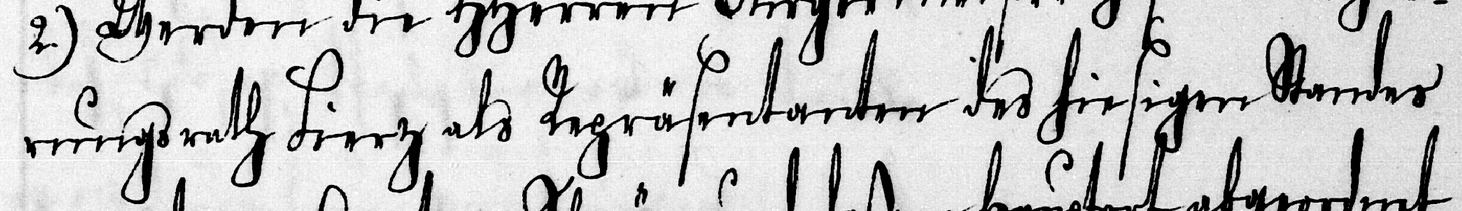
rungsrath Fierz als Repräsentanten des hiesigen Standes
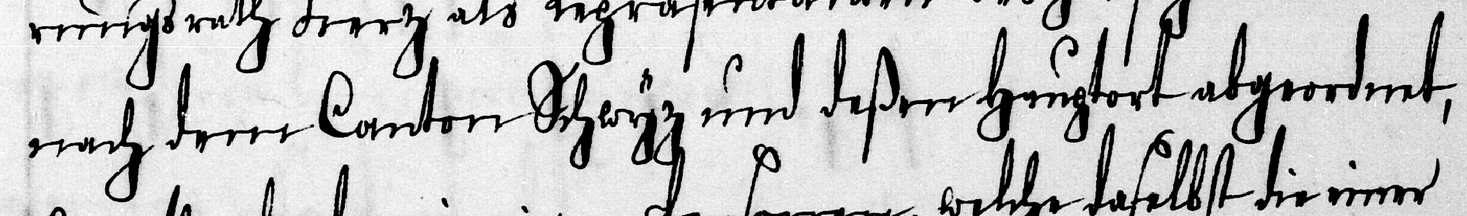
nach dem Canton Schwyz und deßen Hauptort abgeordnet,
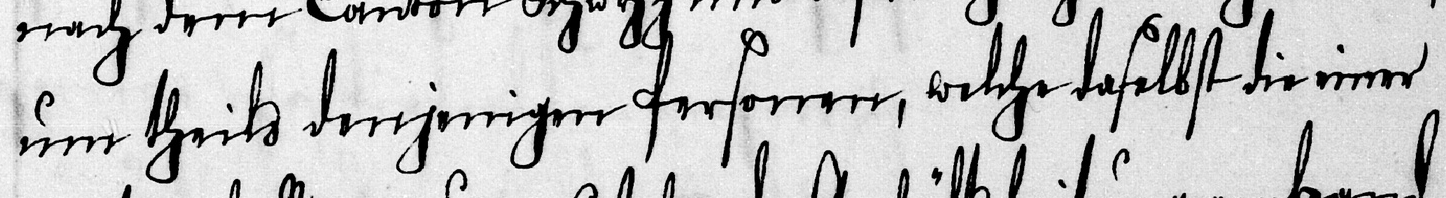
um theils denjenigen Personen, welche daselbst die einer
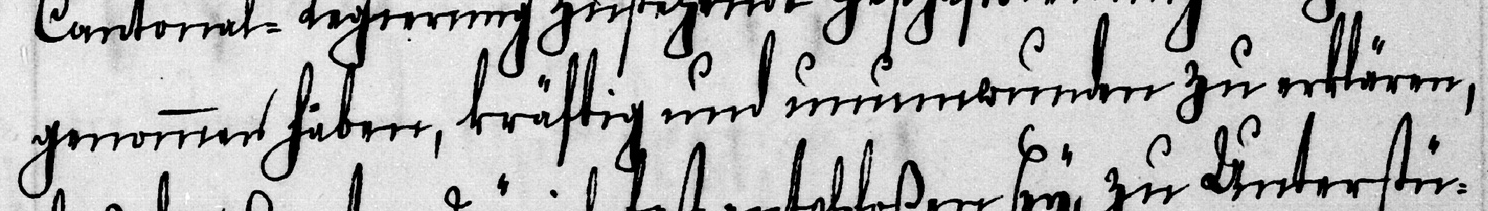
genommen haben, kräftig und unumwunden zu erklären,
